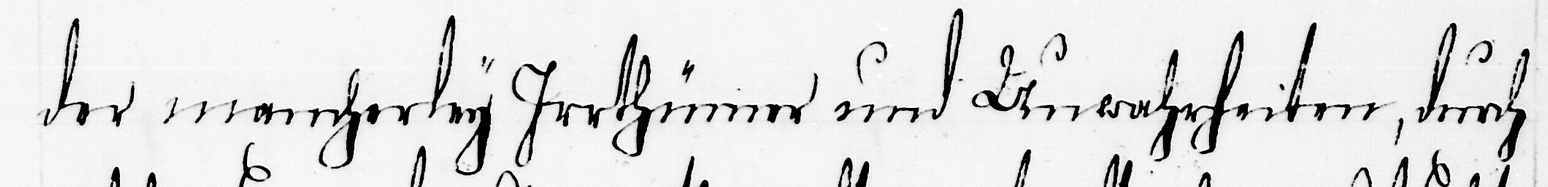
der mancherley Irrthümer und Unwahrheiten, durch
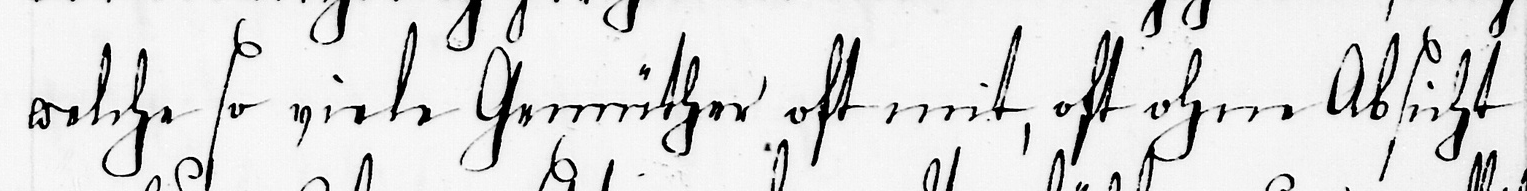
welche so viele Gemüther oft mit, oft ohne Absicht
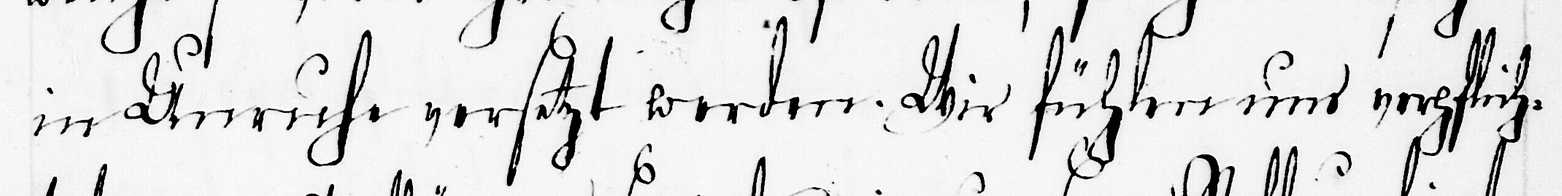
in Unruhe versetzt werden. Wir fühlen uns verpflic¬
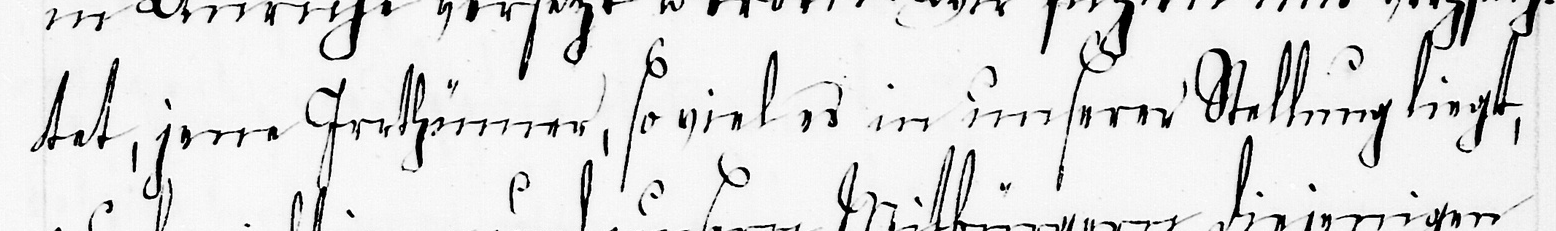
htet, jene Irrthümer, so viel es in unserer Stellung liegt,
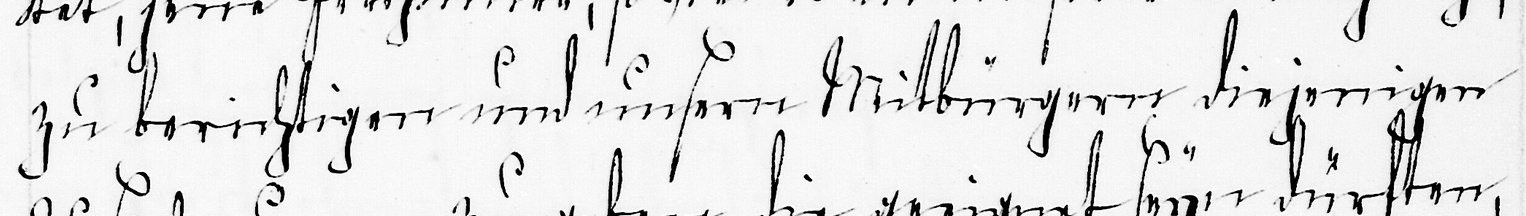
zu berichtigen und unsern Mitbürgern diejenigen
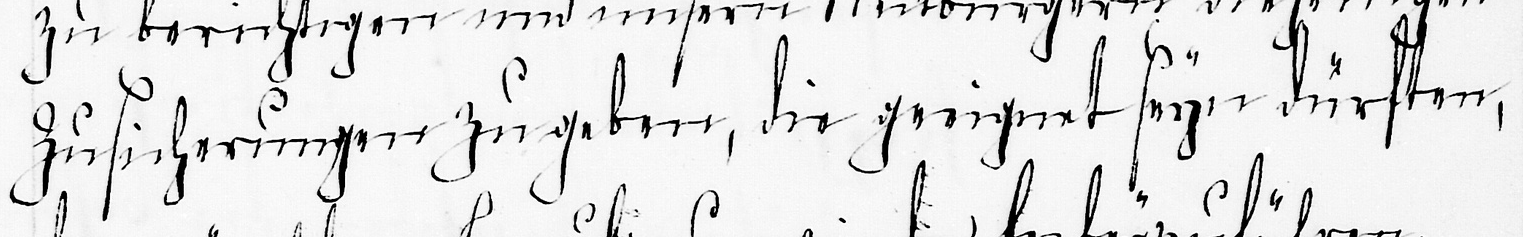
Zusicherungen zu geben, die geeignet seyn dürften,
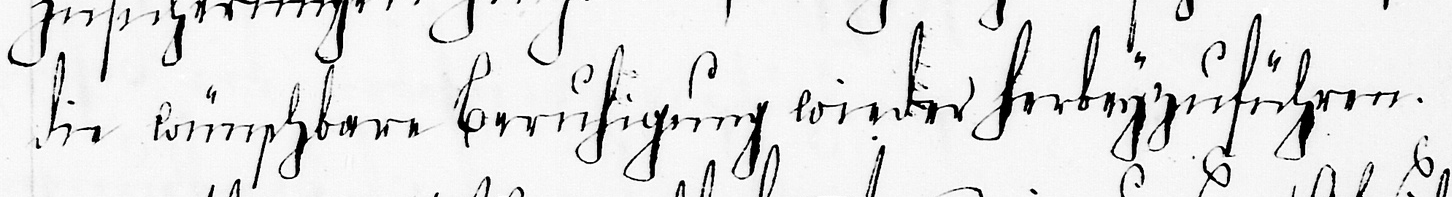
die wünschbare Beruhigung wieder herbeyzuführen.
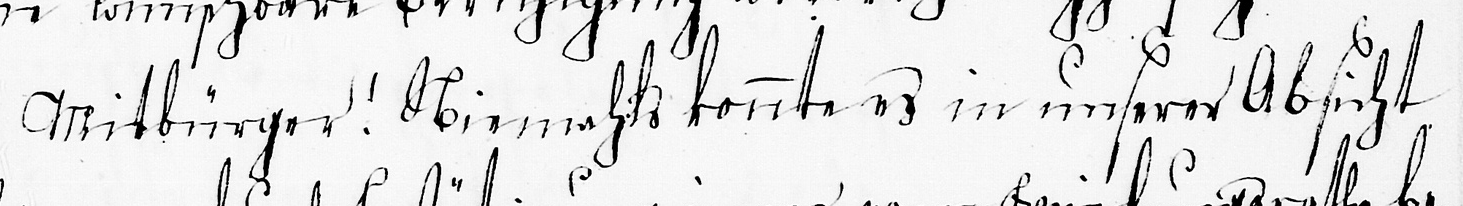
Mitbürger! Niemahls könnte es in unserer Absicht
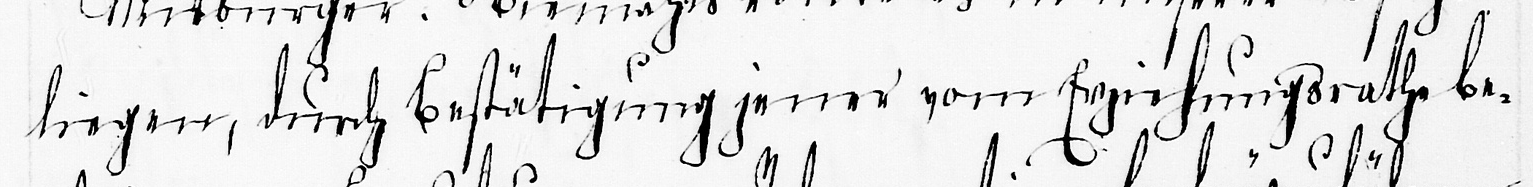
liegen, durch Bestätigung jener vom Erziehungsrathe be¬
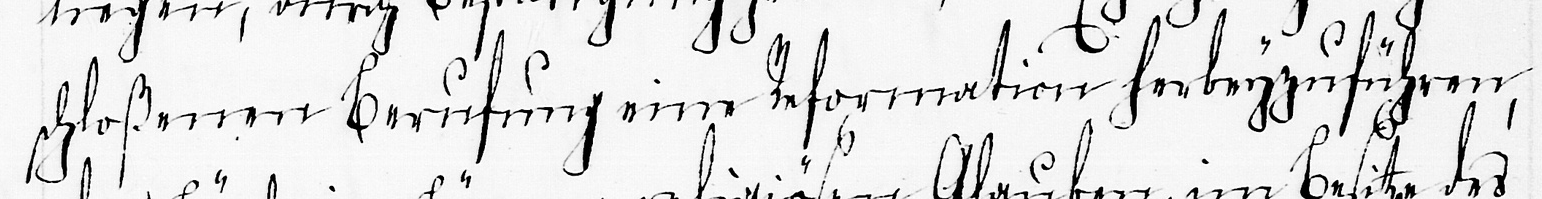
schloßenen Berufung eine Reformation herbeyzuführen,
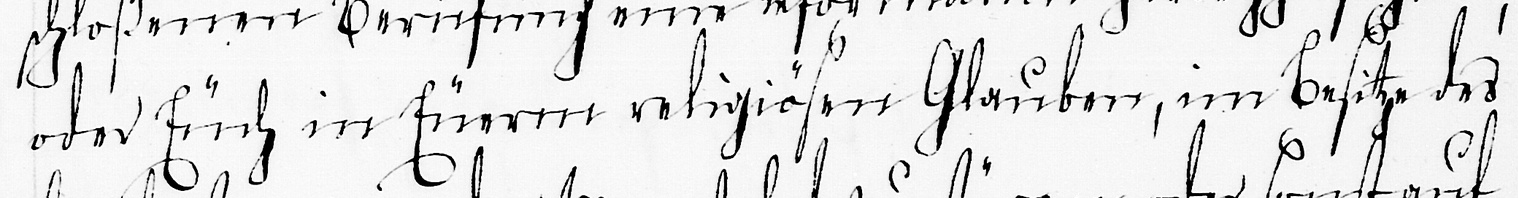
oder Euch in Eurem religiösen Glauben, im Besitze des
